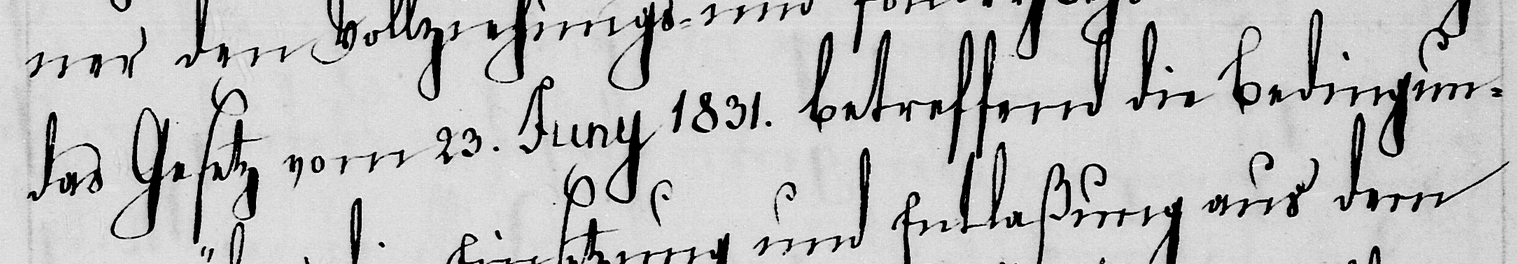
das Gesetz vom 23. Juny 1831. betreffend die Bedingun¬
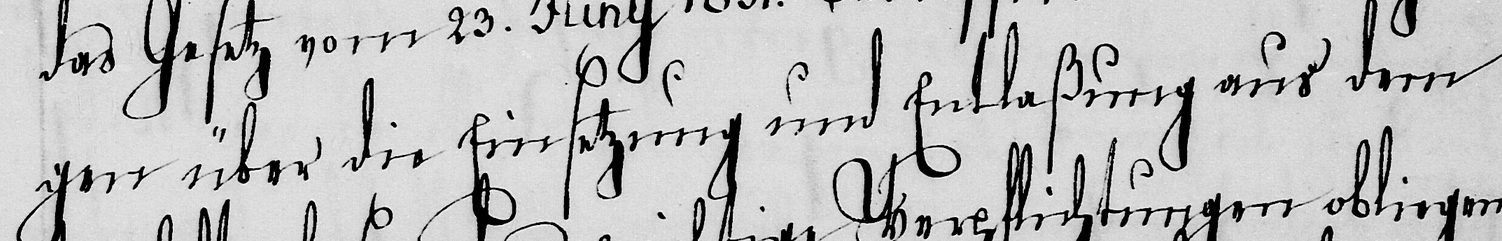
gen über die Einsetzung und Entlaßung aus dem
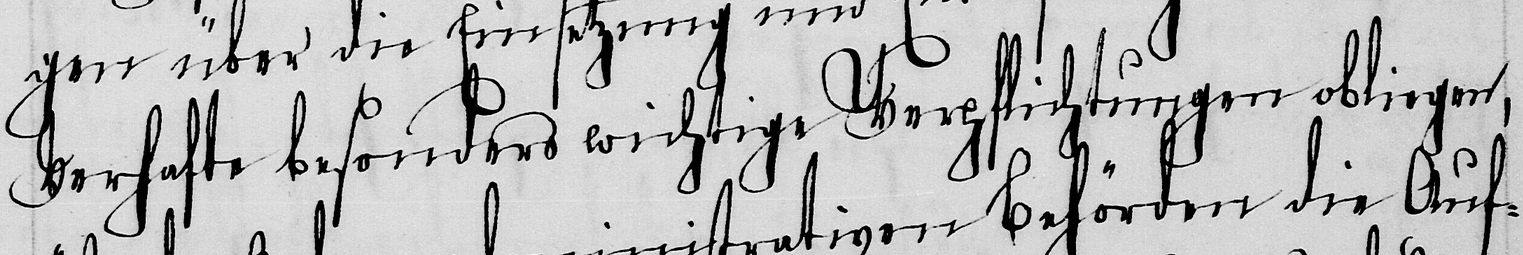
Verhalte besonders wichtige Verpflichtungen obliegen,
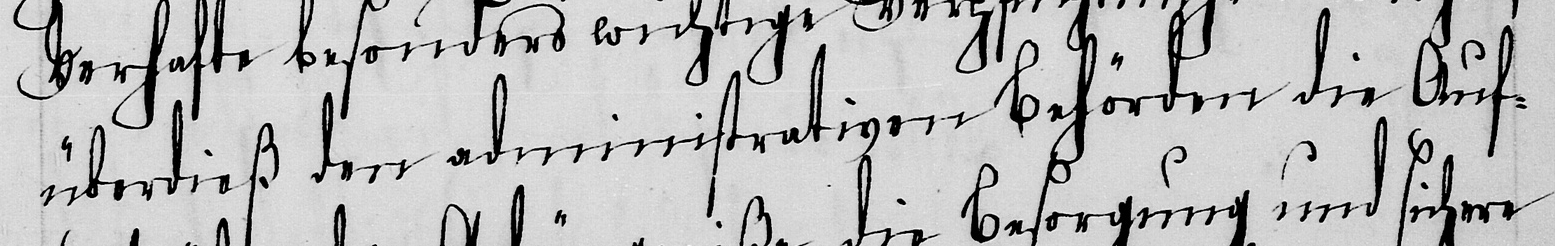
überdieß den administrativen Behörden die Auf¬
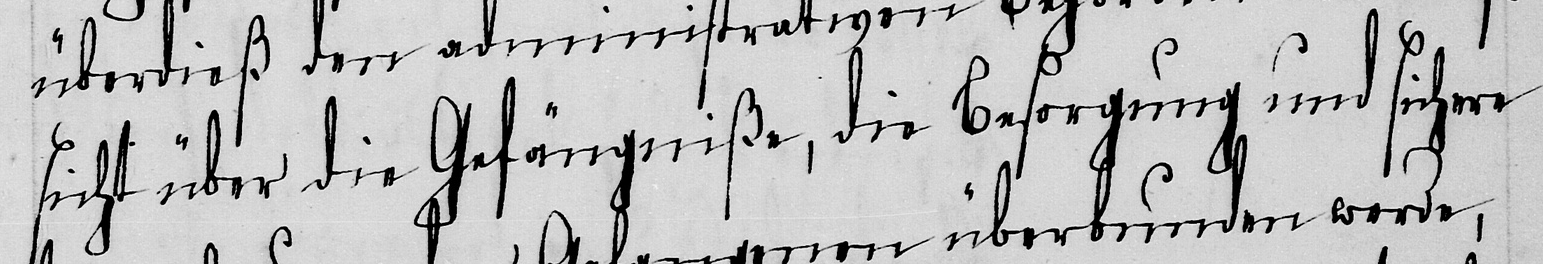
sicht über die Gefängniße, die Besorgung und sichere
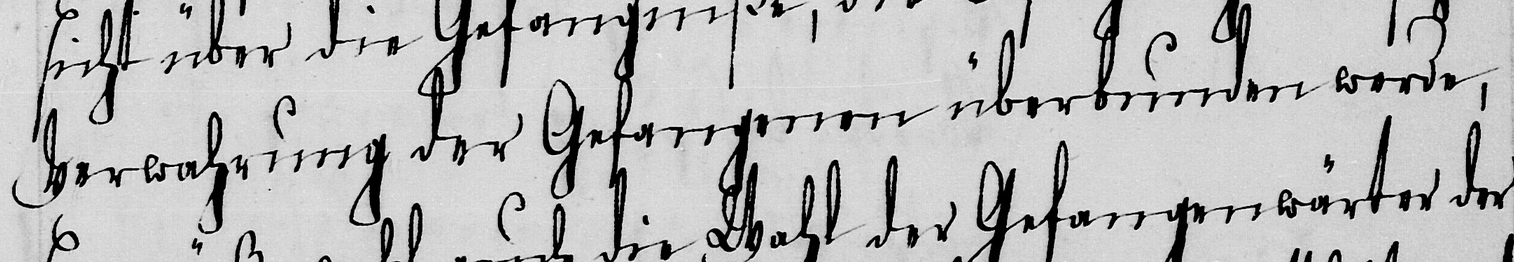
Verwahrung der Gefangenen überbunden werde,
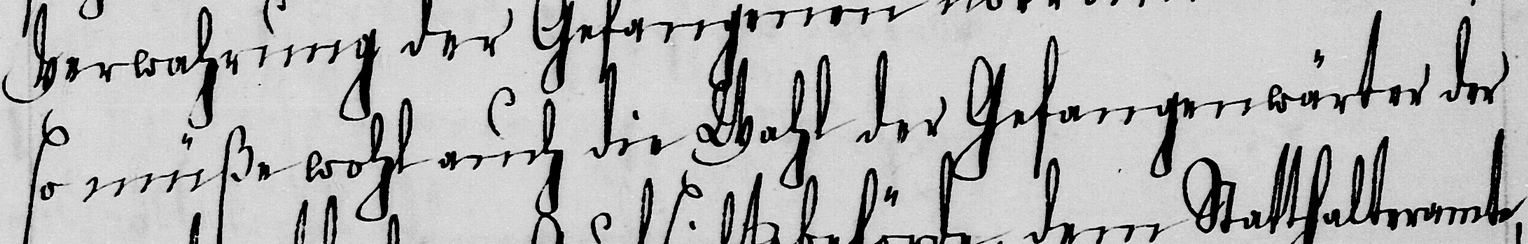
so müße wohl auch die Wahl der Gefangenwärter der
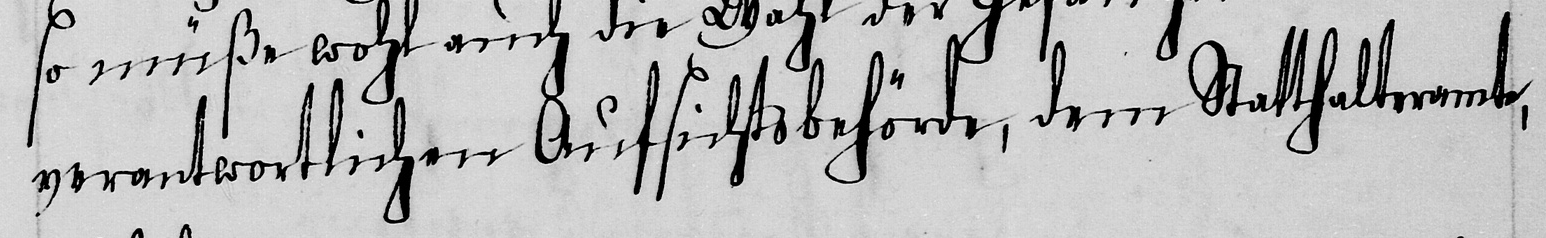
verantwortllichen Aufsichtsbehörde, dem Statthalteram¬
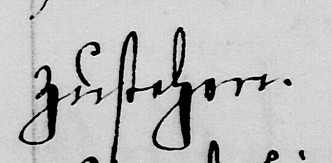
zustehen.
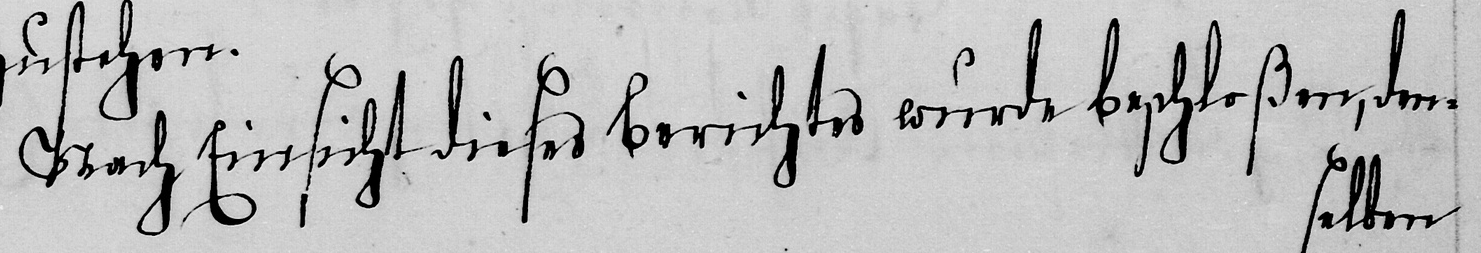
Nach Einsicht dieses Berichtes wurde beschloßen, den-
